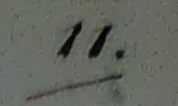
11.
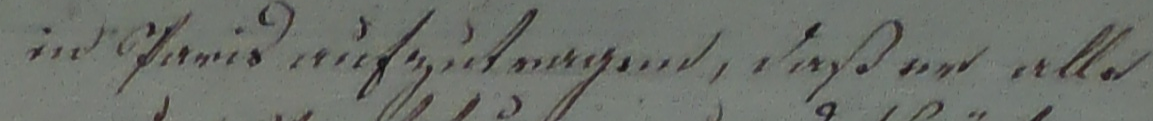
in Paris aufzutragen, daß er alle
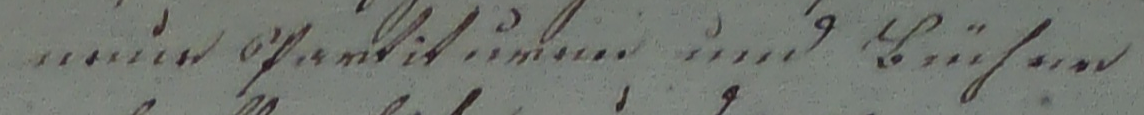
neue Partituren und Bücher
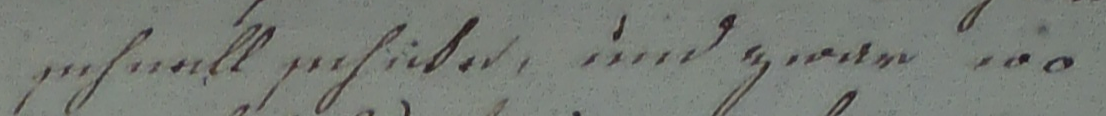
schnell schicke, und zwar wo
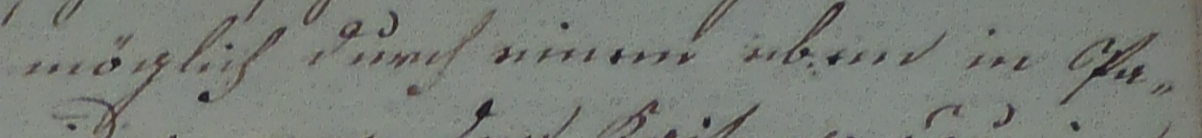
möglich durch einen eben in Pa¬
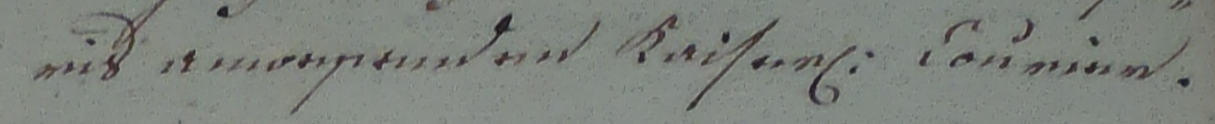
ris anwesenden kaiserE: Courier.
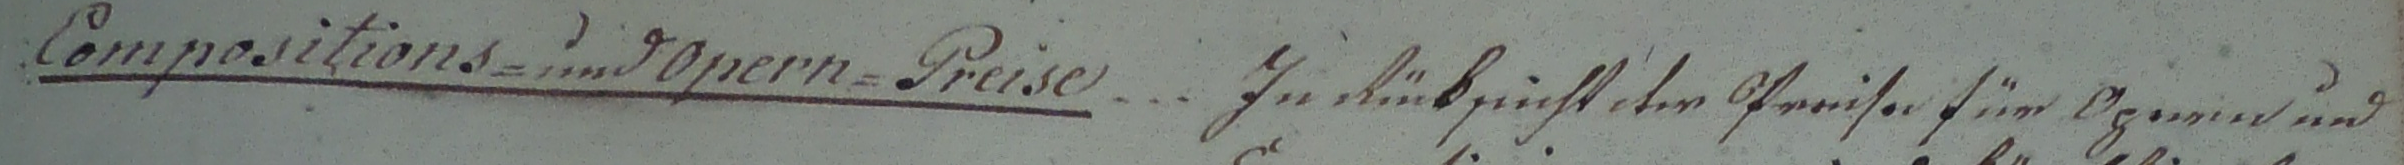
Compositions ‗ und Opern ‗ Preise … In Rücksicht der Preise für Opern und
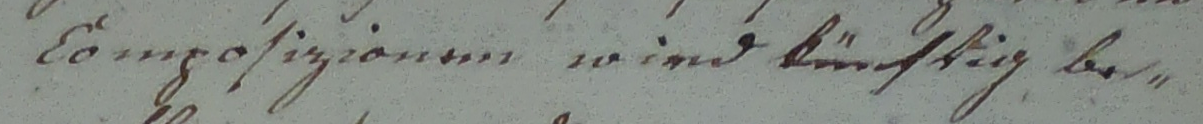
Composizionen wird künftig be¬
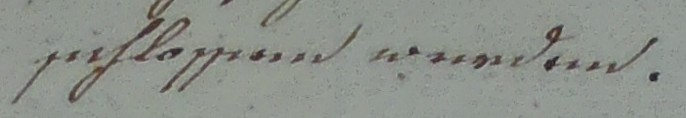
schlossen werden.
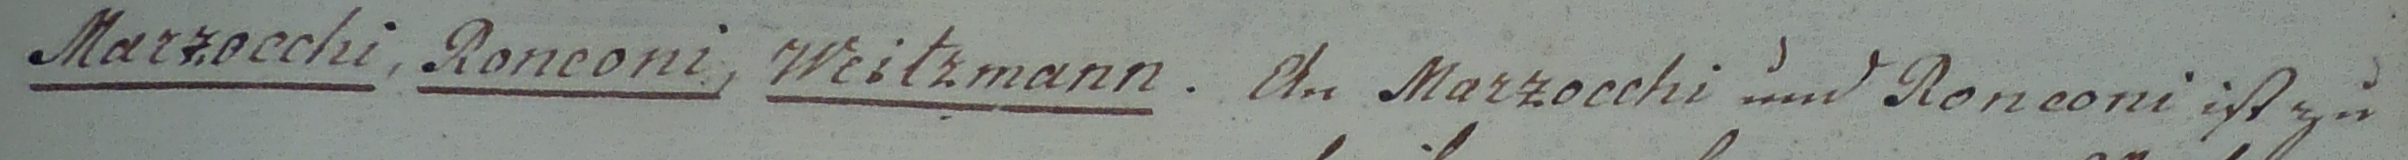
Marzocchi, Ronconi, Weitzmann . An Marzocchi und Ronconi ist zu
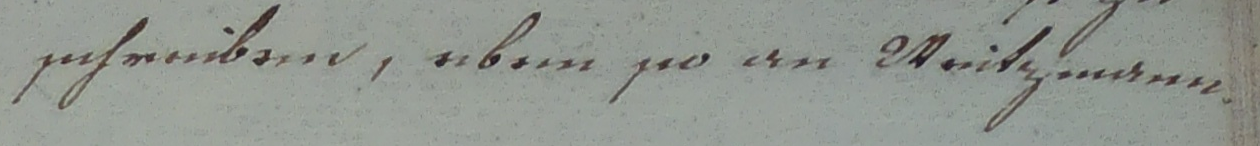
schreiben, eben so an Weitzmann.
